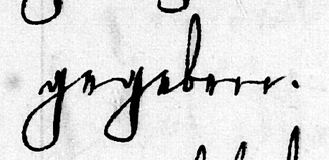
gegeben.
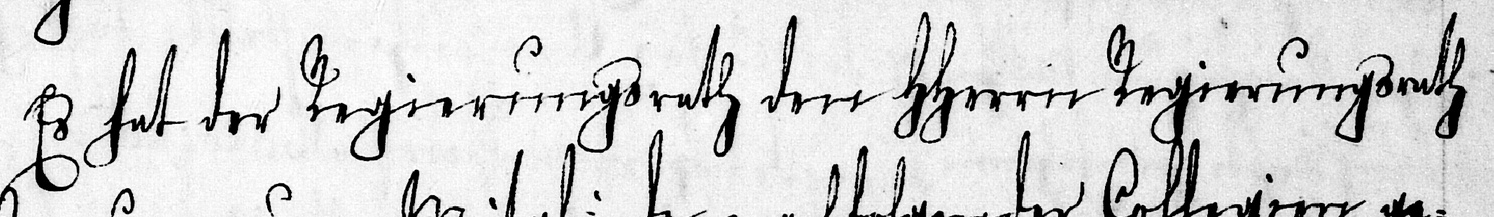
Es hat der Regierungsrath den HHerrn Regierungsrath
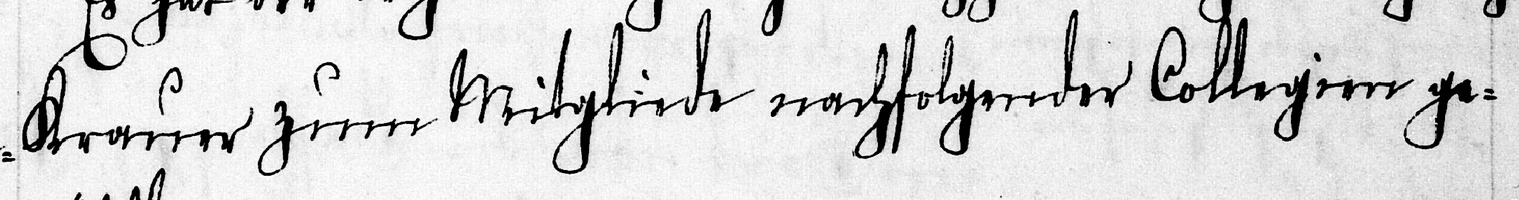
Krauer zum Mitgliede nachfolgender Collegien ge¬
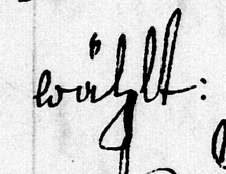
wählt:
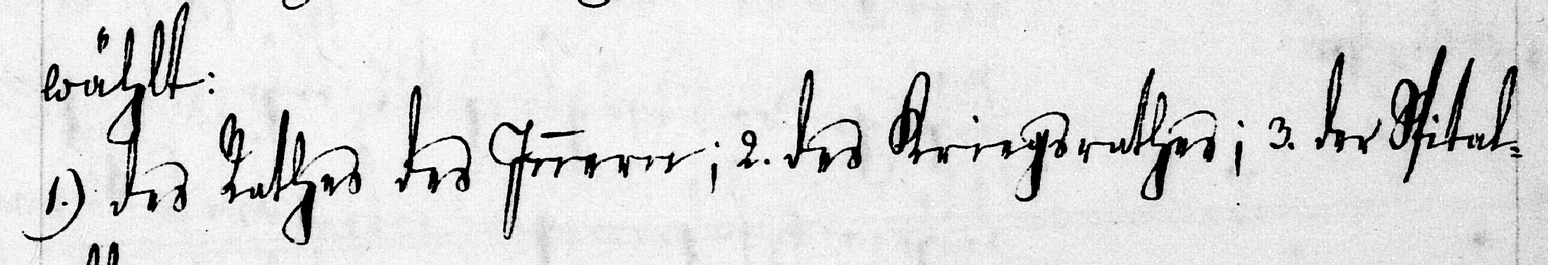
1.) des Rathes des Innern; 2. des Kriegsrathes; 3. der Spital¬
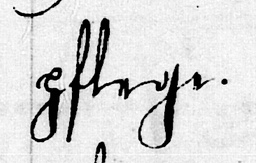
pflege.
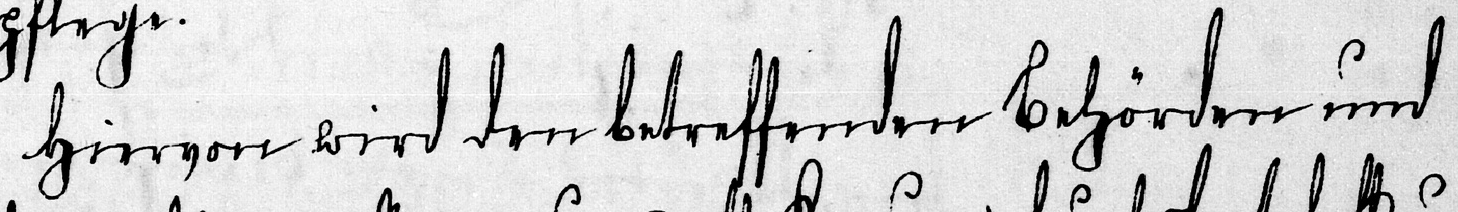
Hiervon wird den betreffenden Behörden und
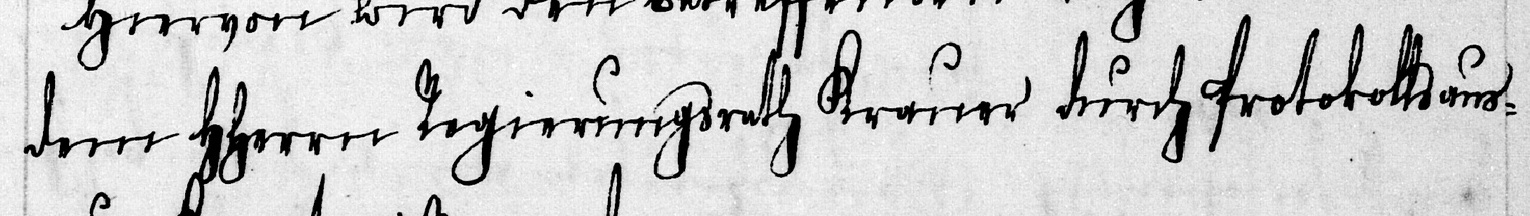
dem HHerrn Regierungsrath Krauer durch Protokollsau¬
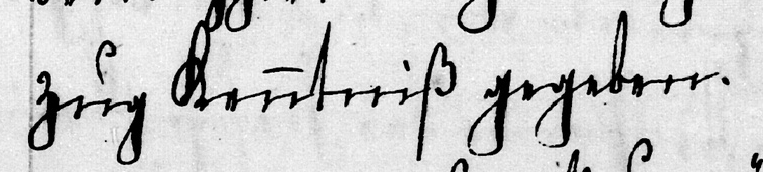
szug Kenntniß gegeben.
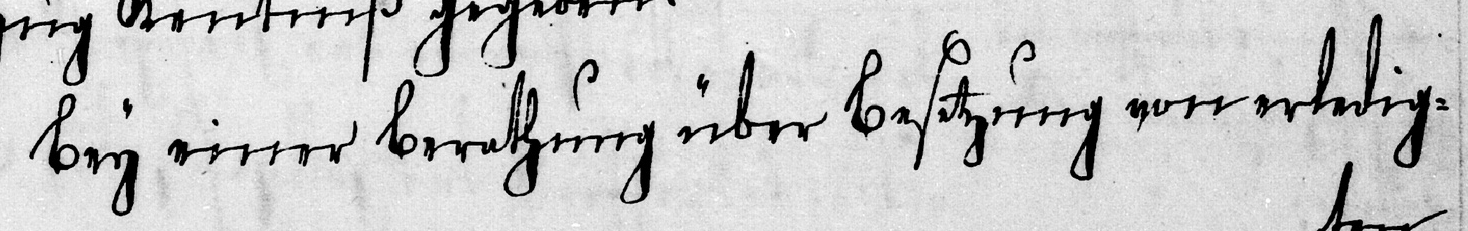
Bey einer Berathung über Besetzung von erledig-
